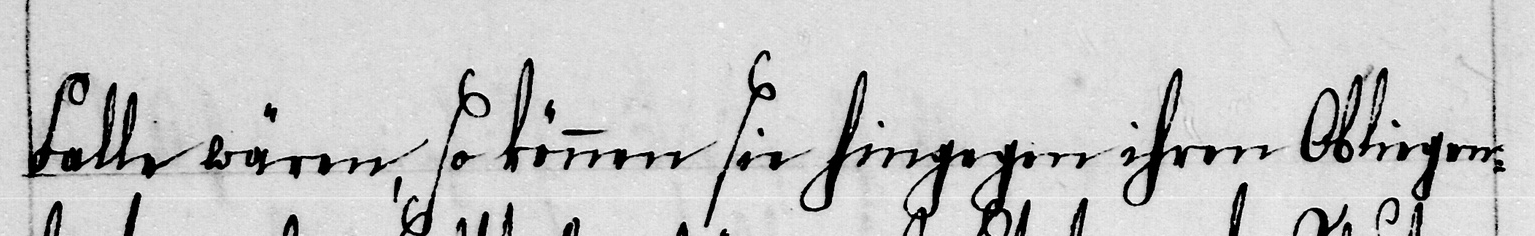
Falle wären, so können sie hingegen ihren Obliegen¬
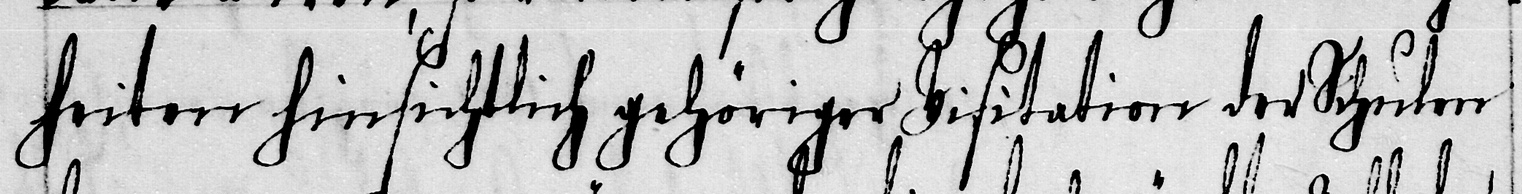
heiten hinsichtlich gehöriger Visitation der Schulen
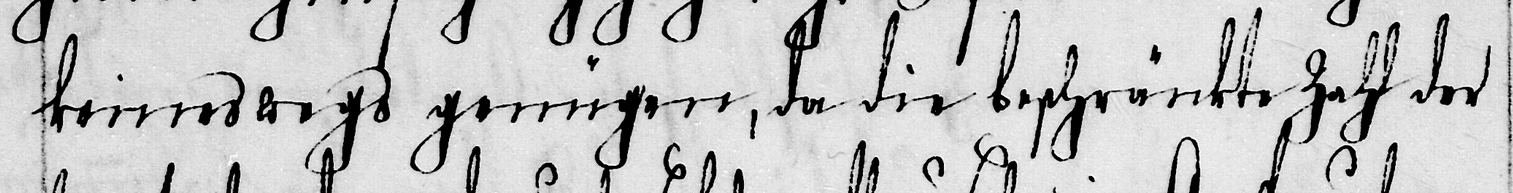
keineswegs genügen, da die beschränkte Zahl der
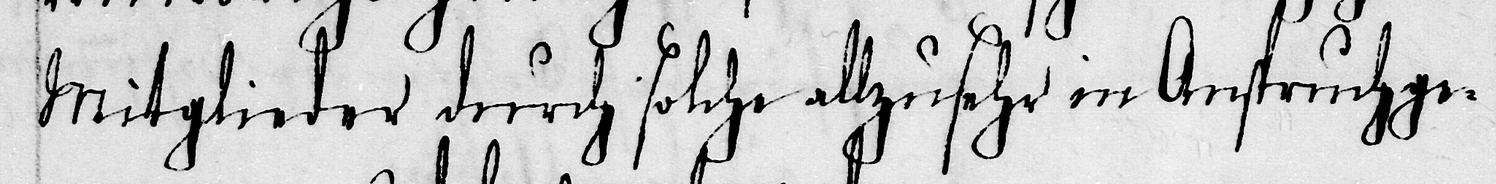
Mitglieder durch solche allzusehr in Anspruch ge¬
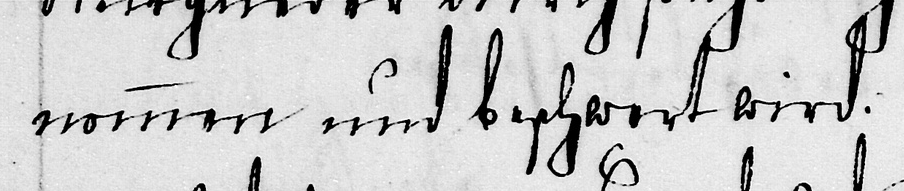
nommen und beschwert wird.
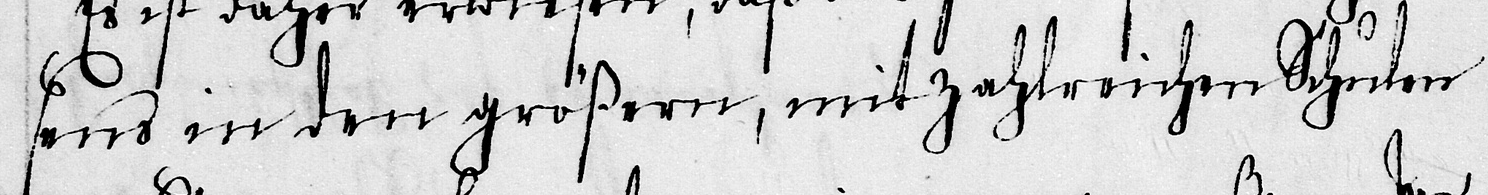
sens in den größern, mit zahlreichen Schulen
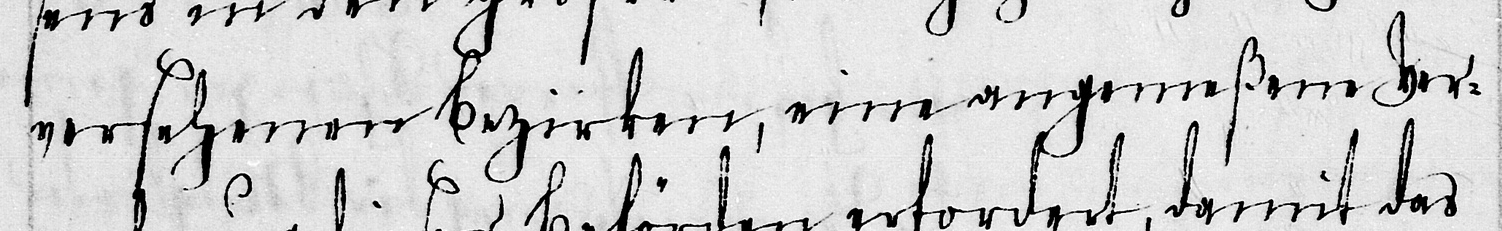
versehenen Bezirken, eine angemeßene Ver¬
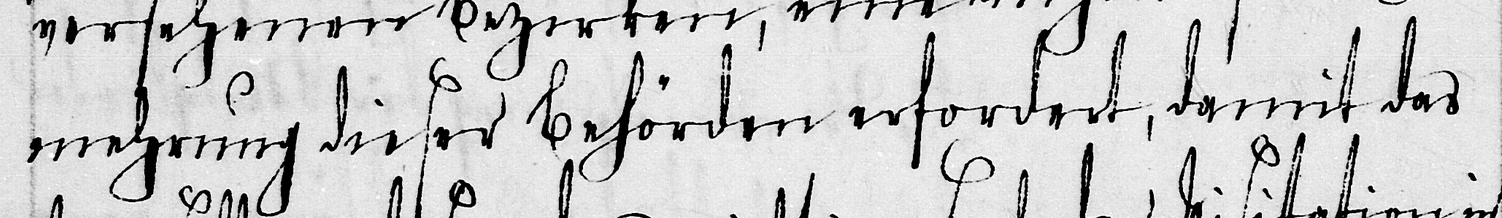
mehrung dieser Behörden erfordert, damit das
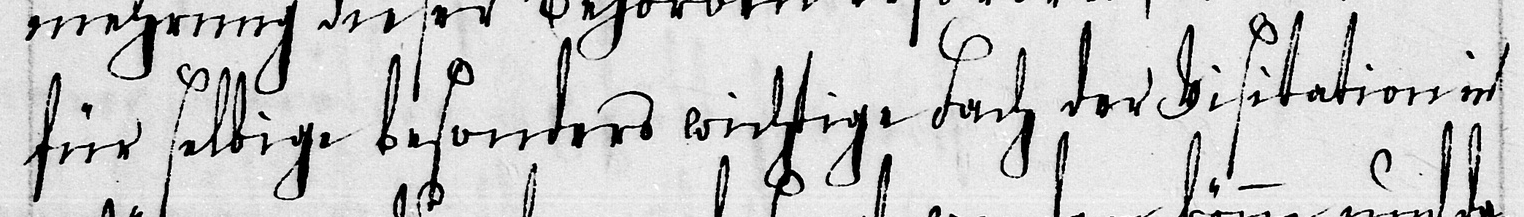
für selbige besonders wichtige Fach der Visitation in
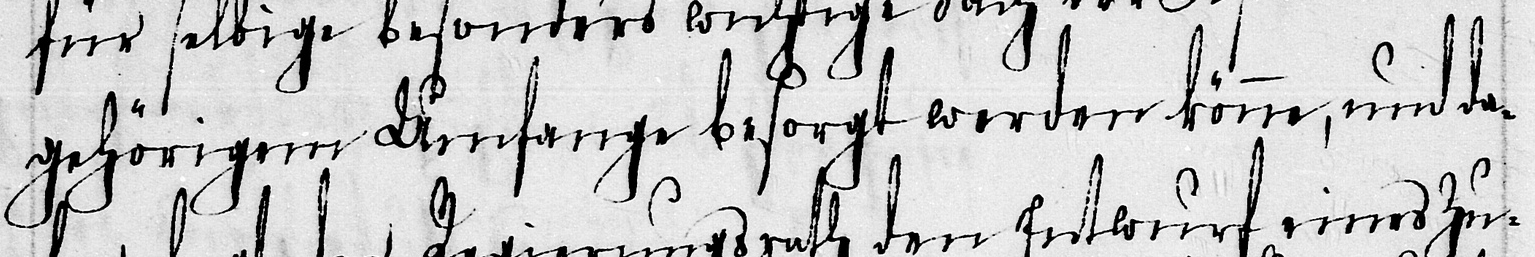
gehörigem Umfange besorgt werden könne, und da¬
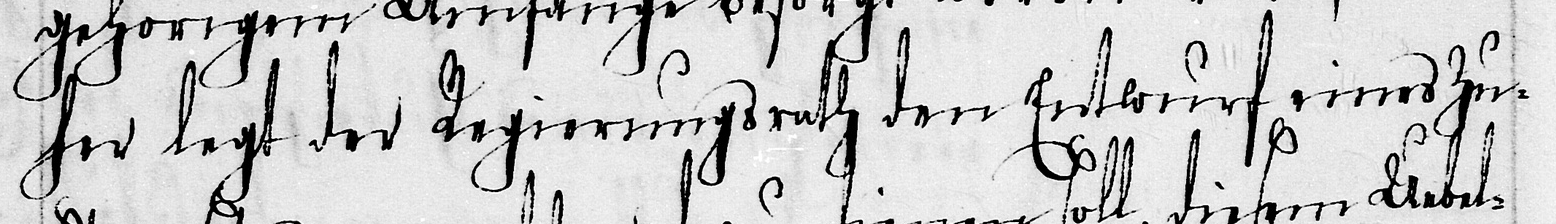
her legt der Regierungsrath den Entwurf eines Zu¬
